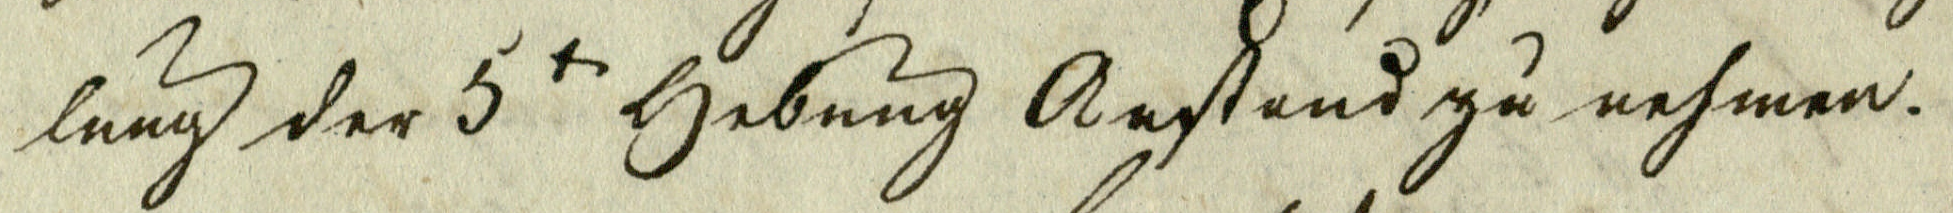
lung der 5ten Hebung Anstand zu nehmen.
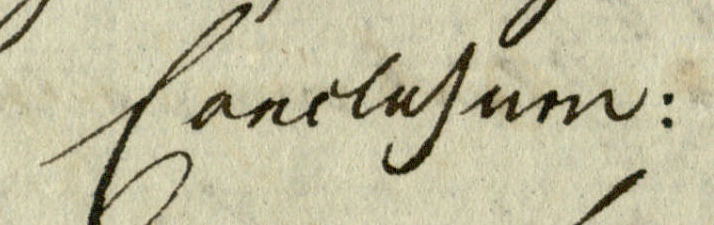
Conclusum:
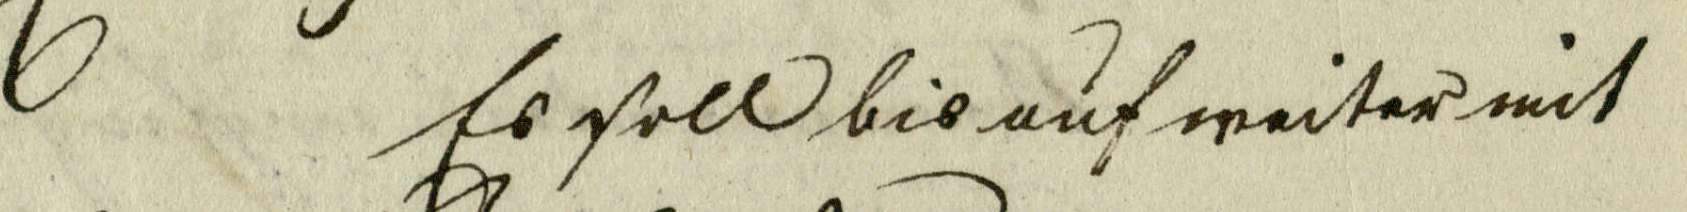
Es soll bis auf weiter mit
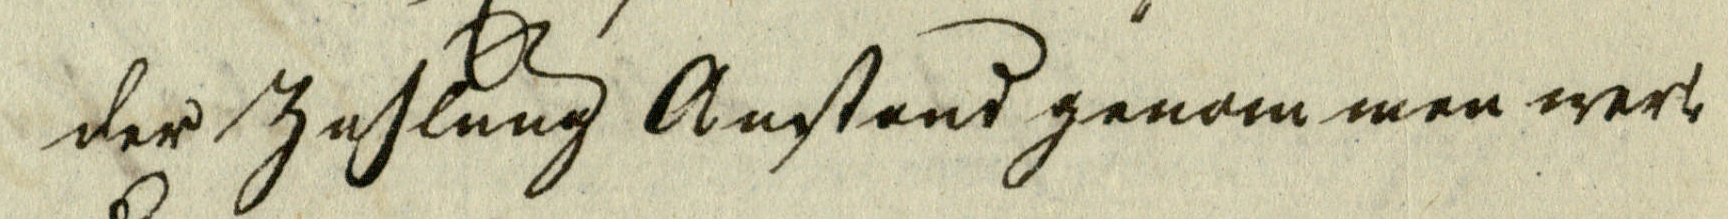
der Zahlung Anstand genommen wer¬
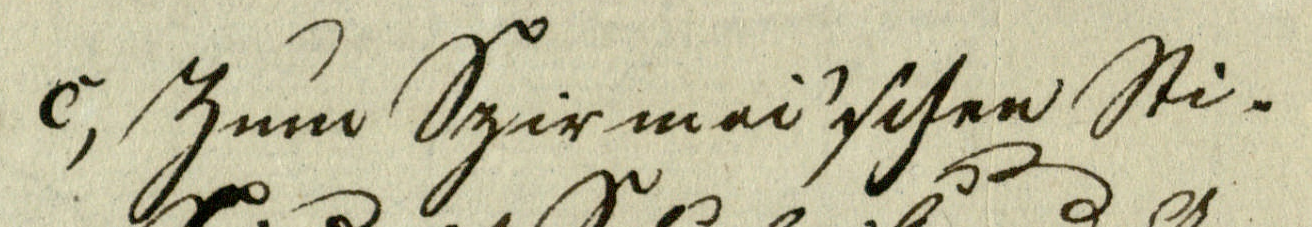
c, Zum Szirmai'schen Sti¬
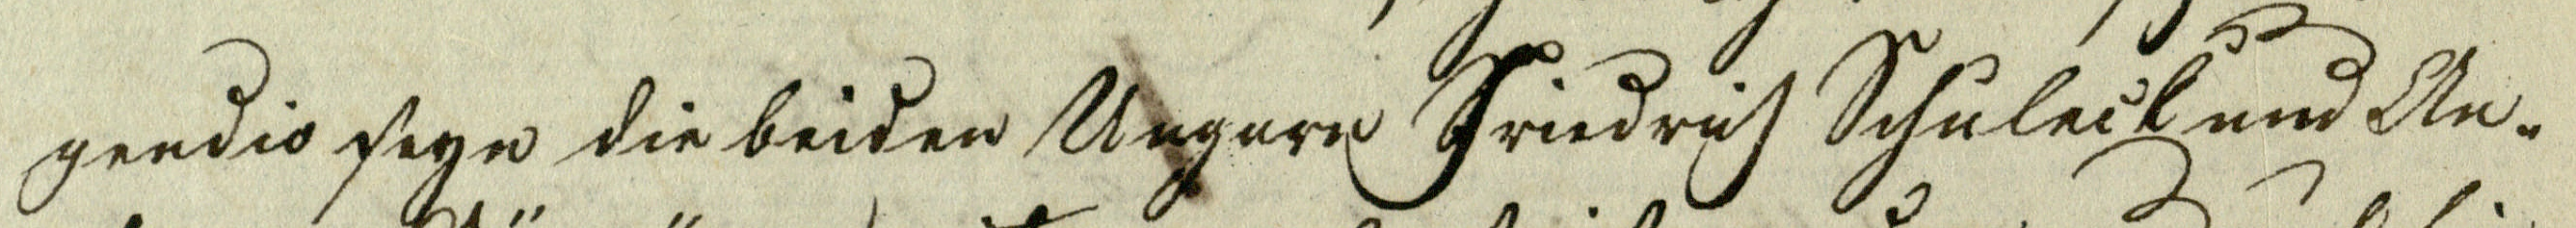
pendio seyn die beiden Ungarn Friedrich Schuleck und An¬
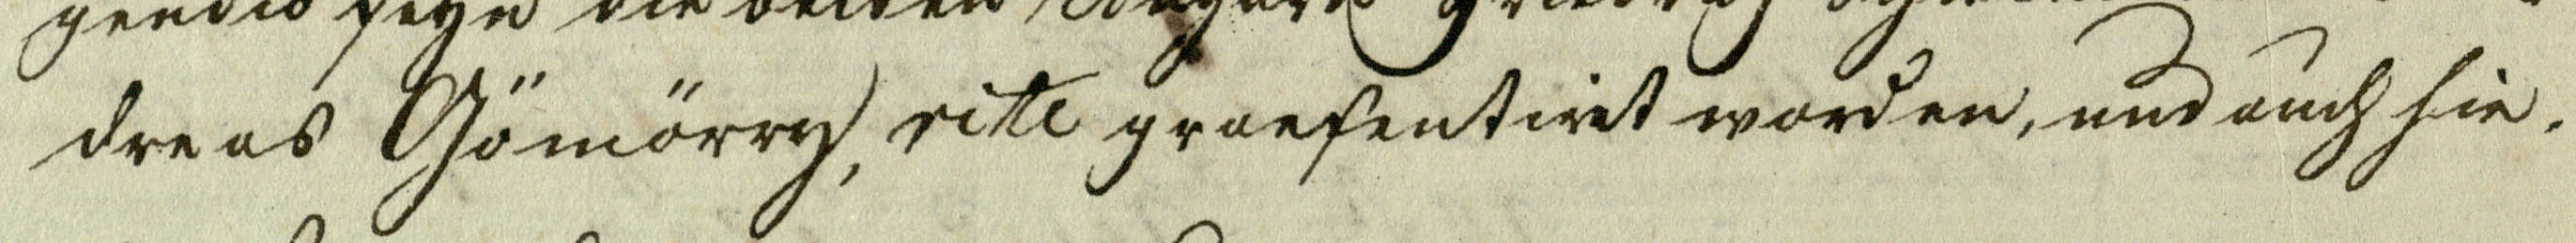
dreas Gömörry, rite praesentiret worden, und auch hie¬
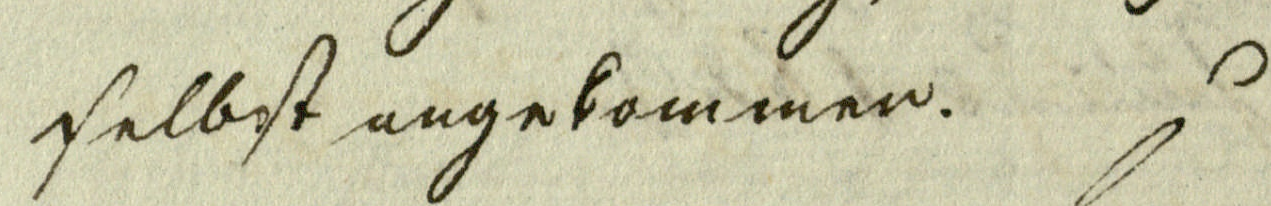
selbst angekommen.
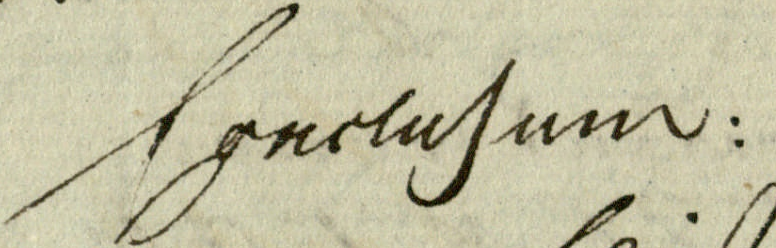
Conclusum:
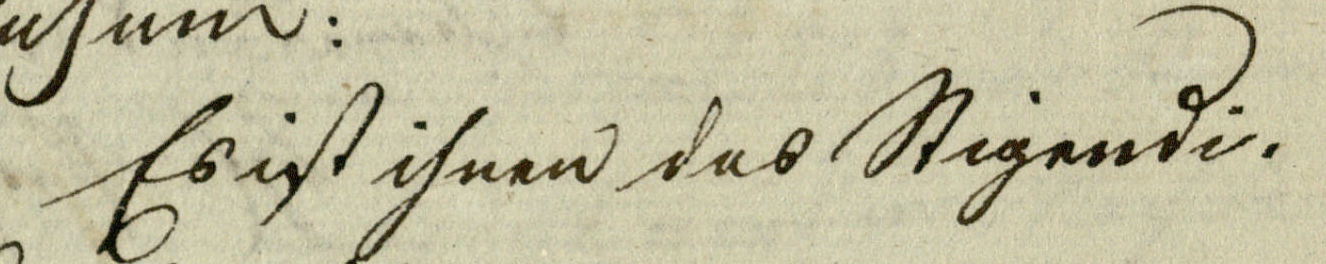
Es ist ihnen das Stipendi¬
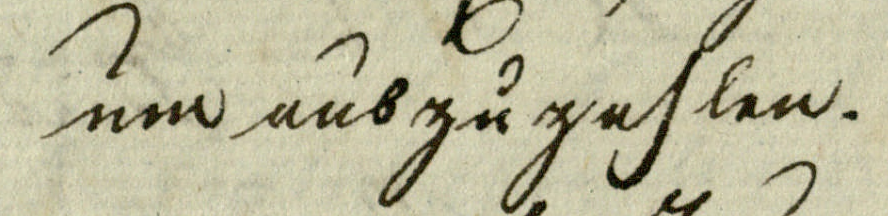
um auszuzahlen.
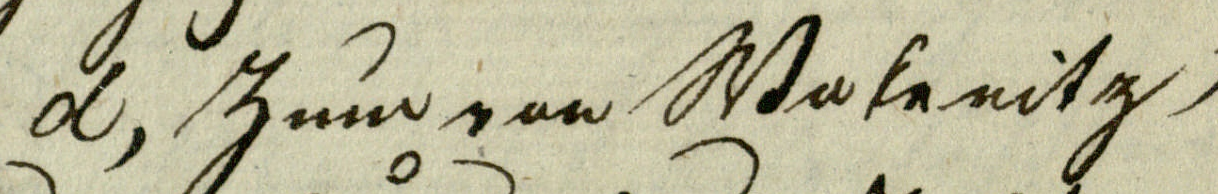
d, Zum von Wakenitz'
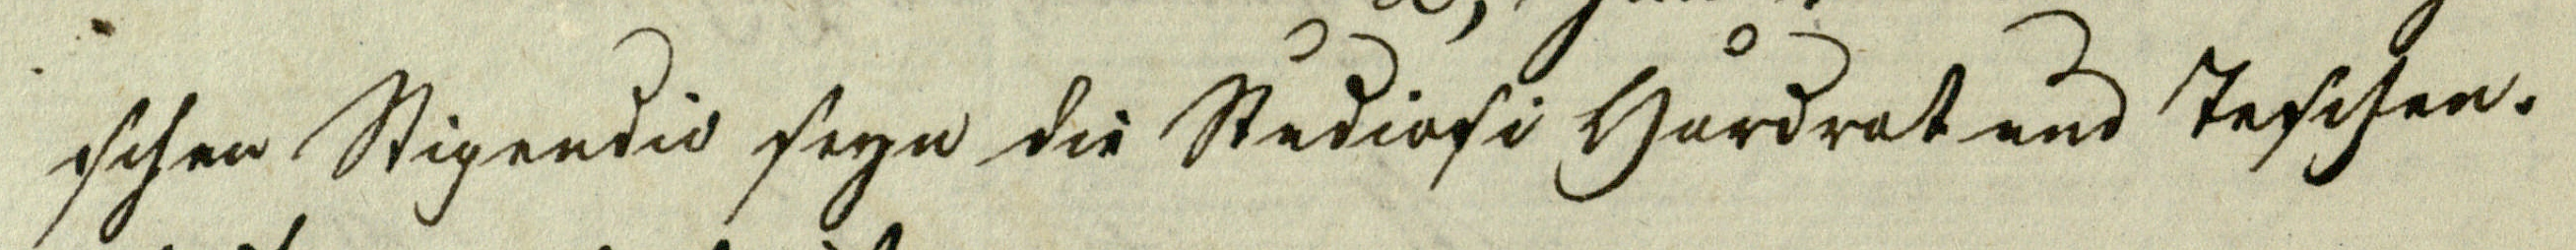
schen Stipendio seyn die Studiosi Hardrat und Teschen¬
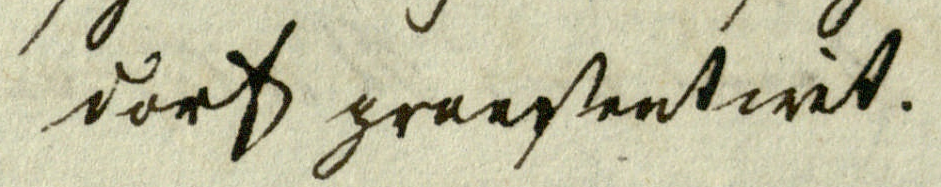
dorf praesentiret.
